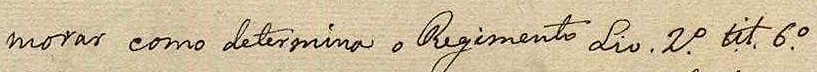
morar como determina o Regimento Liv. 2.º tit. 6.º
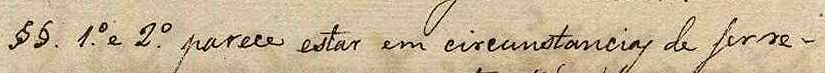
§§. 1.º e 2.º parece estar em circunstancias de ser re
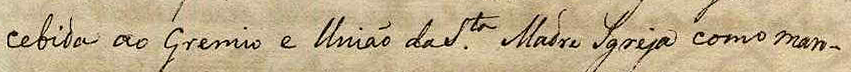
cebida ao Gremio e Uniaõ da S.ta Madre Igreja como man
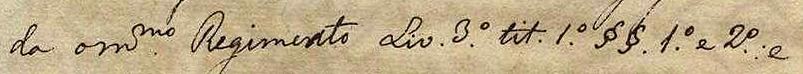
da o m.mo Regimento Liv. 3.º tit. 1.º §§. 1.º e 2.º e
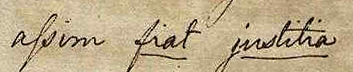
assim fiat justitia
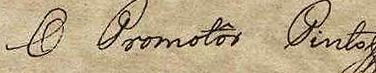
O Promotôr Pinto
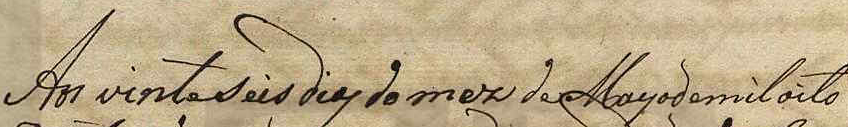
Aos vinte seis dias do mez de Mayo de mil oito
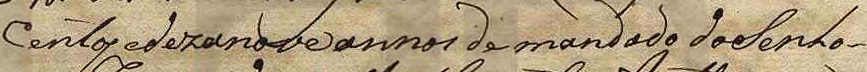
centos e dezanove annos de mandado do Senho
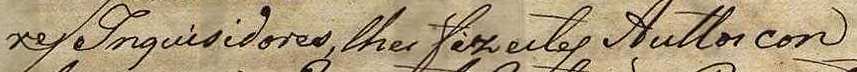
res Inquisidores, lhes fiz estes Auttos con
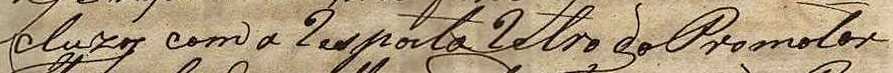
cluzos com a Resposta Retro do Promotor
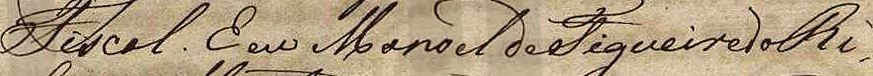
Fiscal. E eu Manoel de Figueiredo Ri
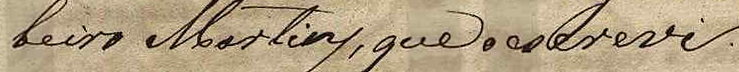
beiro Martins, que o escrevi.
